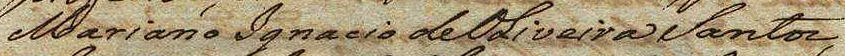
Mariano Ignacio de OLiveira Santoz,
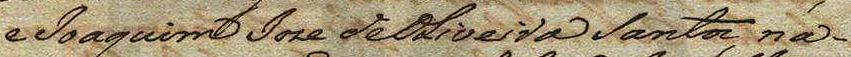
e Ioaquim Ioze de OLiveira Santoz na
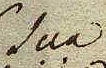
s. sua
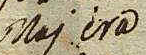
Maj era
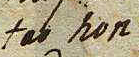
taõ hon
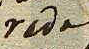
rada
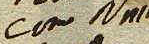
como Nossa
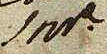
snr.a
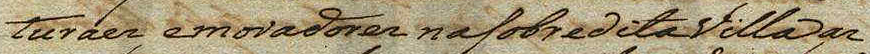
turaez, e moradorez na sobredita Villa az
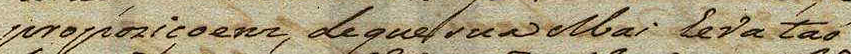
propoziçoenz, de que sua Mai hera taõ
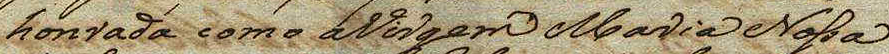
honrada como a Virgem Maria Nossa
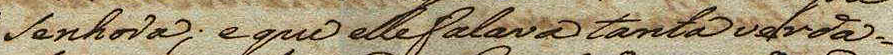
senhora; e que elle falava tanta verda
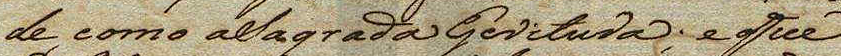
de como a Sagrada Escritura; e que
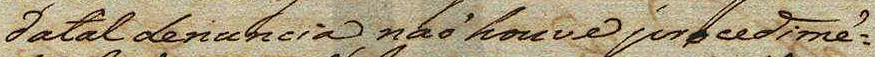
da tal denuncia naõ houve procedimē
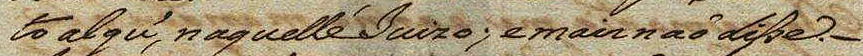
to algū, naquelle Iuizo; e maiz naõ disse.
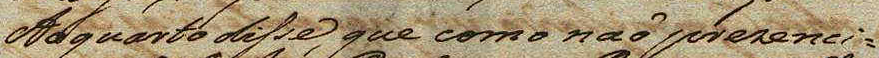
Ao quarto disse, que como naõ prezenci
